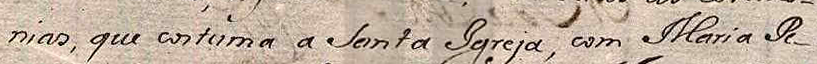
nias, que costuma a Santa Igreja, com Maria Pe
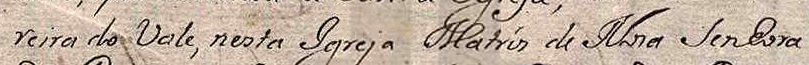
reira do Vale, nesta Igreja Matrís de Nosa Senhora
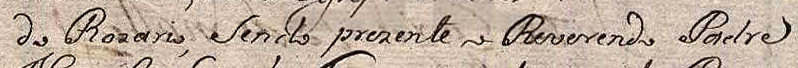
do Rozario, Sendo prezente o Reverendo Padre
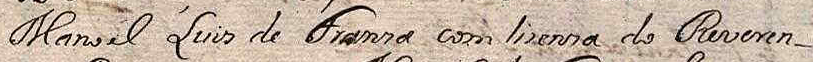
Manoel Luis de Fransa com lisensa do Reveren
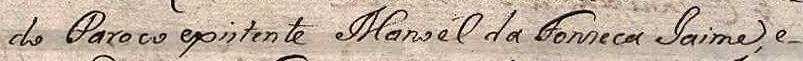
do Paroco existente Manoel da Fonseca Iaime, e
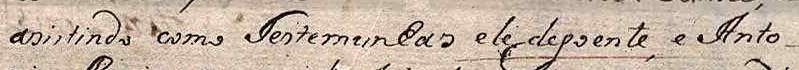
asistindo como Testemunhas ele depoente, e Anto
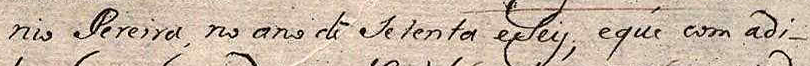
nio Pereira no ano de setenta e seis, e que com a di
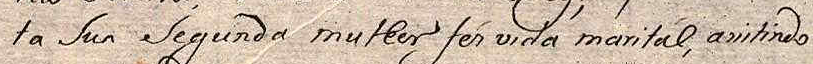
ta sua segunda mulher fés vida marital, asistindo
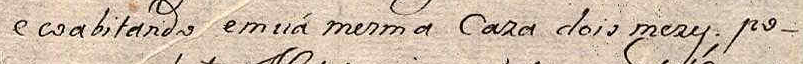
e coabitando em uā mesma Caza dois mezes; po
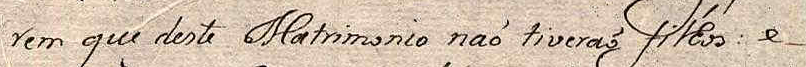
rem que deste Matrimonio naõ tiveraõ filhos. e
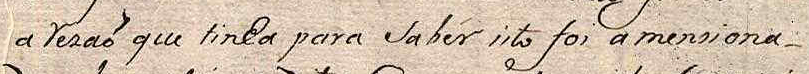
a Rezaõ que tinha para saber isto foi a mensiona
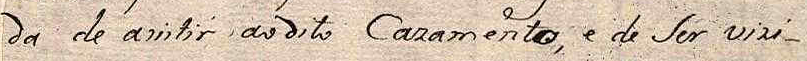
da de asistir ao dito Cazamento, e de ser vizi
